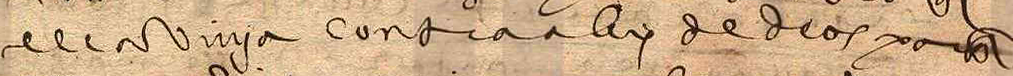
ella viuja contra a ley de deos porq̄
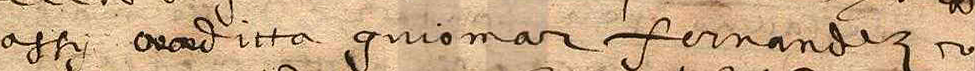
assy aa ditta guiomar fernandez co
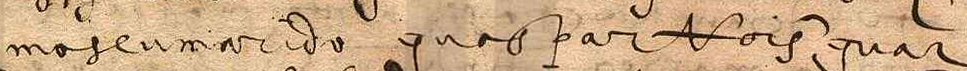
mo seu marido guaspar Rois̄ guar
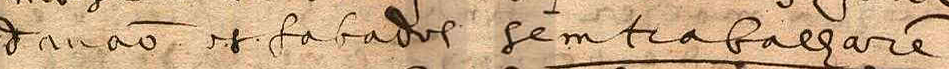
dauão os sabados sem trabalharē
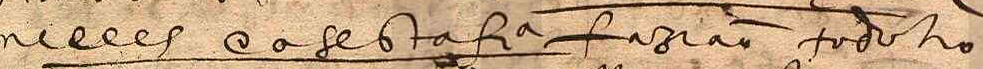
nelles e a sesta fra fazião todo ho
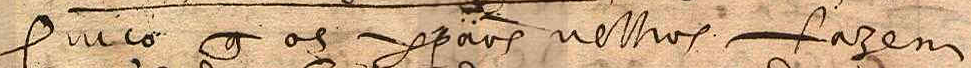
ꞩuiço q̄ os xpãos uelhos fazem
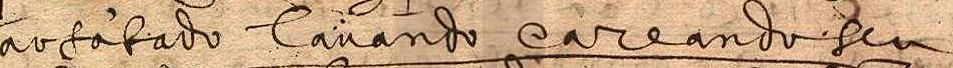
ao sabado lauando e areando seu
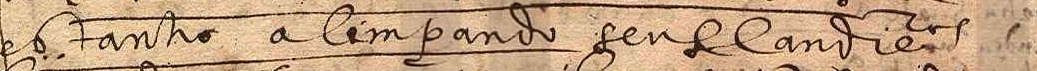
estanho alimpando seus Candieros
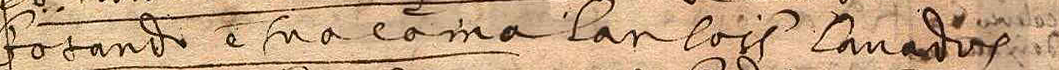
botando ē sua cama lançois̄ lauados
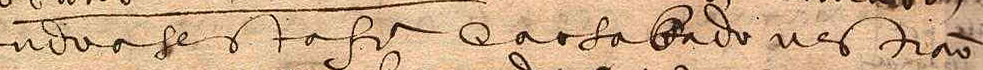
tudo a sesta fra E ao sabado uestião
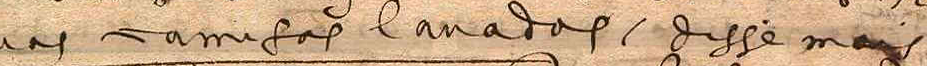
suas camisas lauadas / disse mais
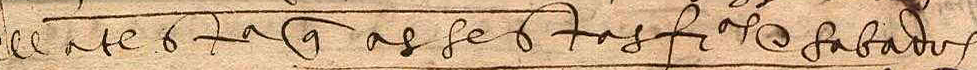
ella testa q̄ as sestas fras E sabados
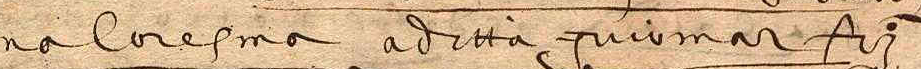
na Coresma a ditta guiomar frz̄
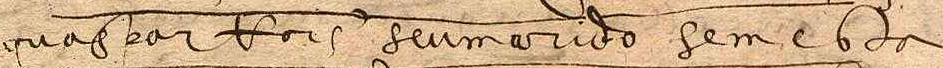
guaspar Rois̄ seu marido sem esta
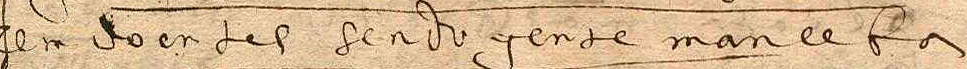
rem doentes sendo gente manceba
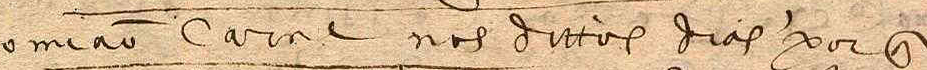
comião carne nos dittos dias porq̄
